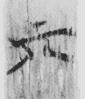亓
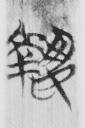執
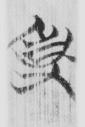事
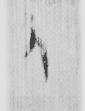人
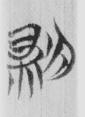則
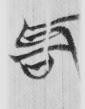{㠯ㅋ}
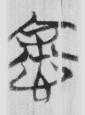{余心}
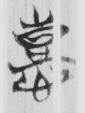𢝫
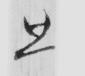也
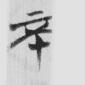不
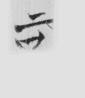可
